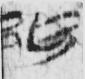○（鄢）
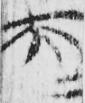大夫
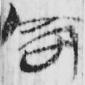命
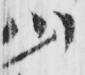少
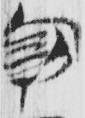○（宰）
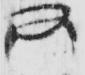尹
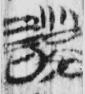○（察）
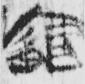○（聞）
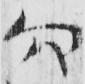大
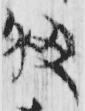○（梁）
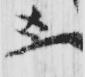之
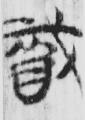戠
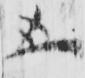之
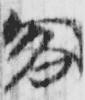客
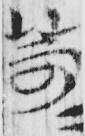苛
